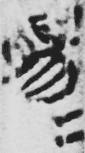陽陽
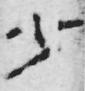少（小）
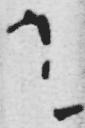人
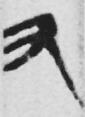又（有）
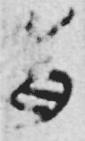兔
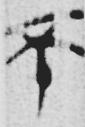不
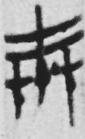奉（逢）
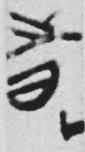○（時）
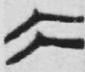大
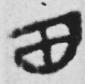田
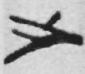之
